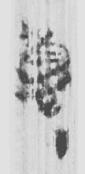惪
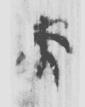夫
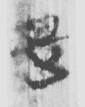是
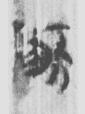所
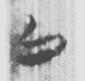㠯（以）
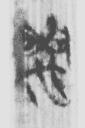閟
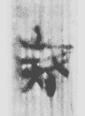者
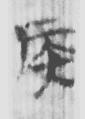侯
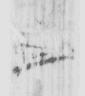之
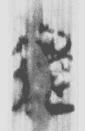{辶各}
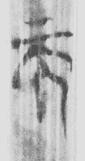而
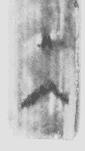{十六}
